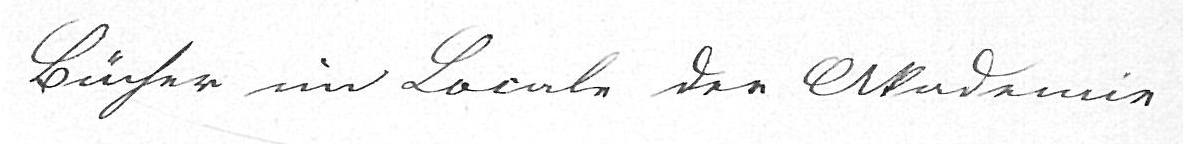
Bücher im Locale der Akademie
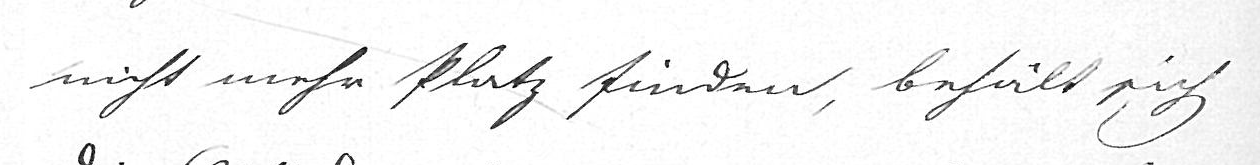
nicht mehr Platz finden, behält sich
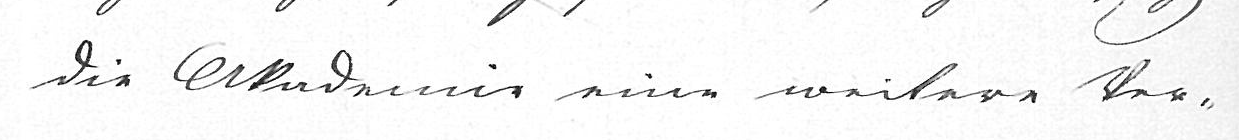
die Akademie eine weitere Ver-
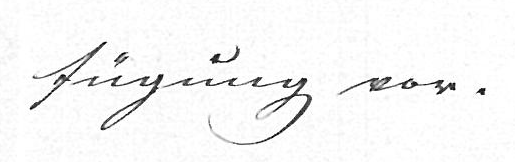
fügung vor.
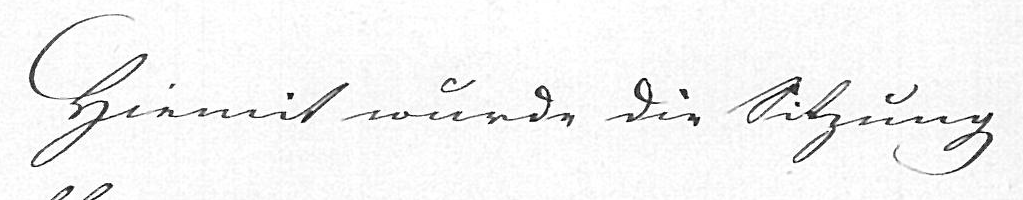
Hiemit wurde die Sitzung
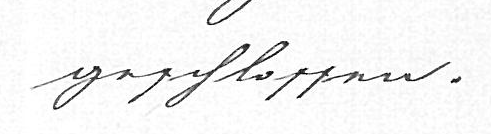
geschlossen.
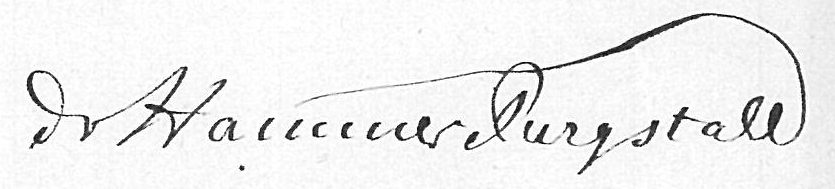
DrHammerPurgstall
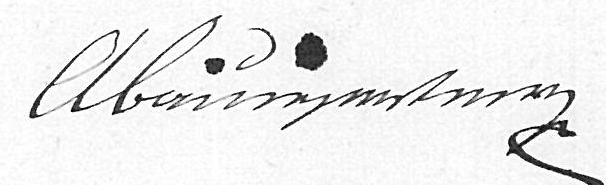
ABaumgartner
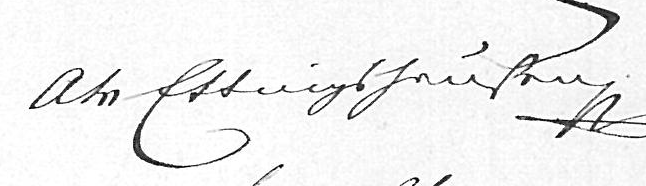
Av Ettingshausen
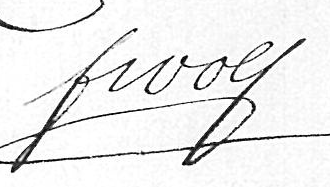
FWolf
